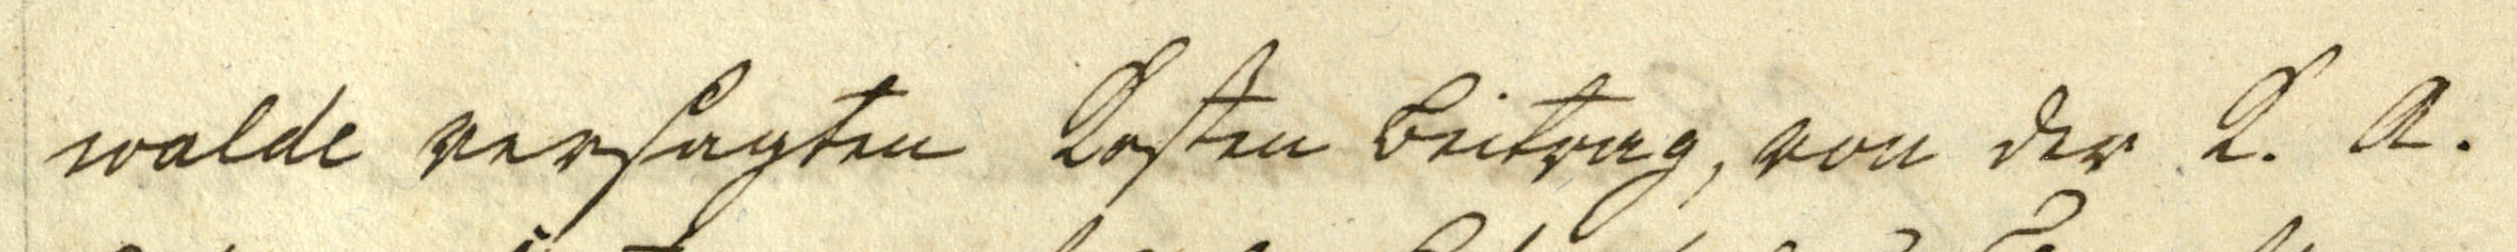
walde versagten Kosten Beitrag, von der K. A.
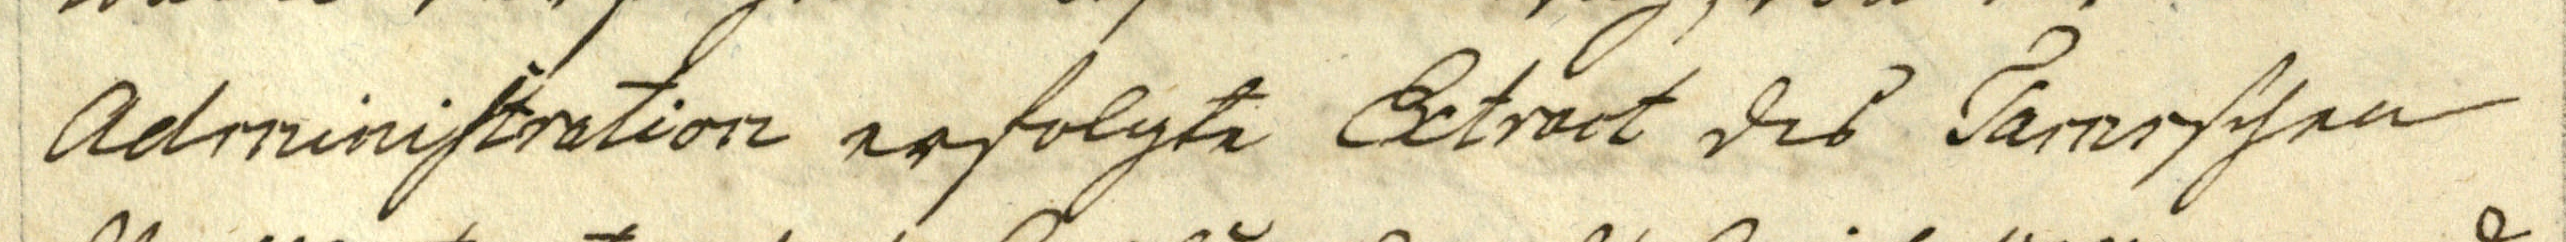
Administration erfolgte Extract des Tamsschen
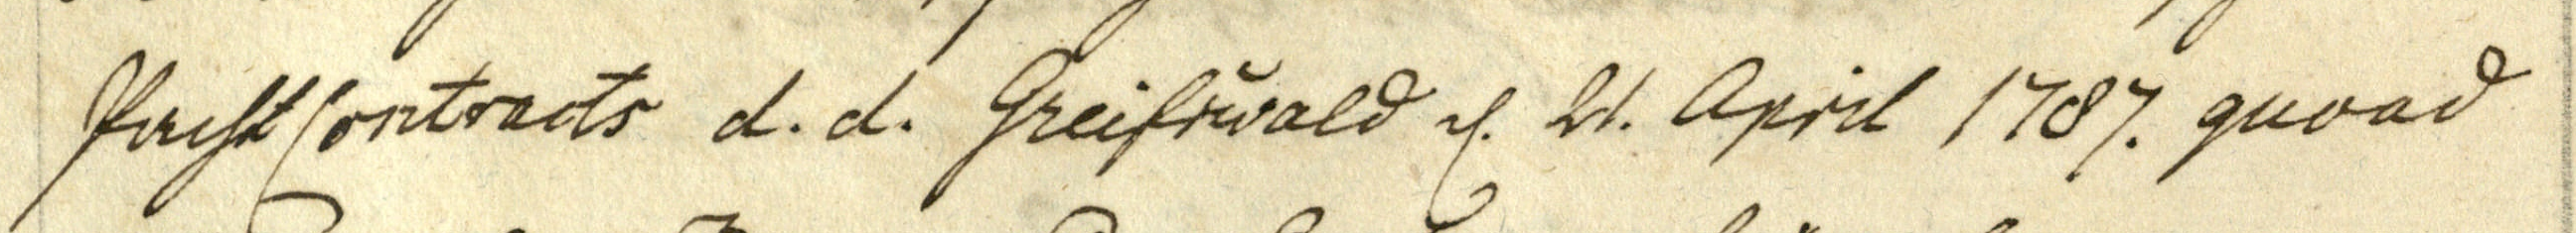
Pacht Contracts d. d. Greifswald d. 21. April 1787. quoad
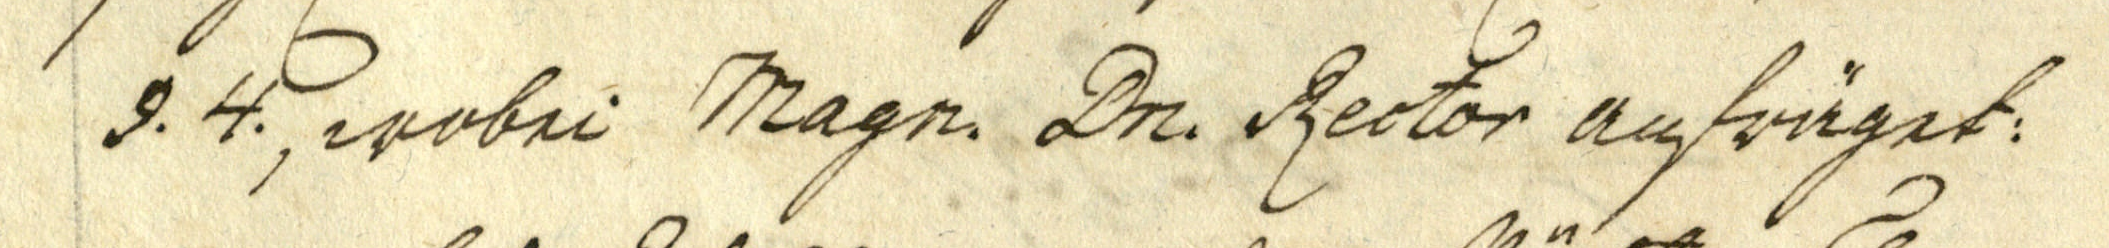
§. 4., wobei Magn. Dn. Rector anfräget:
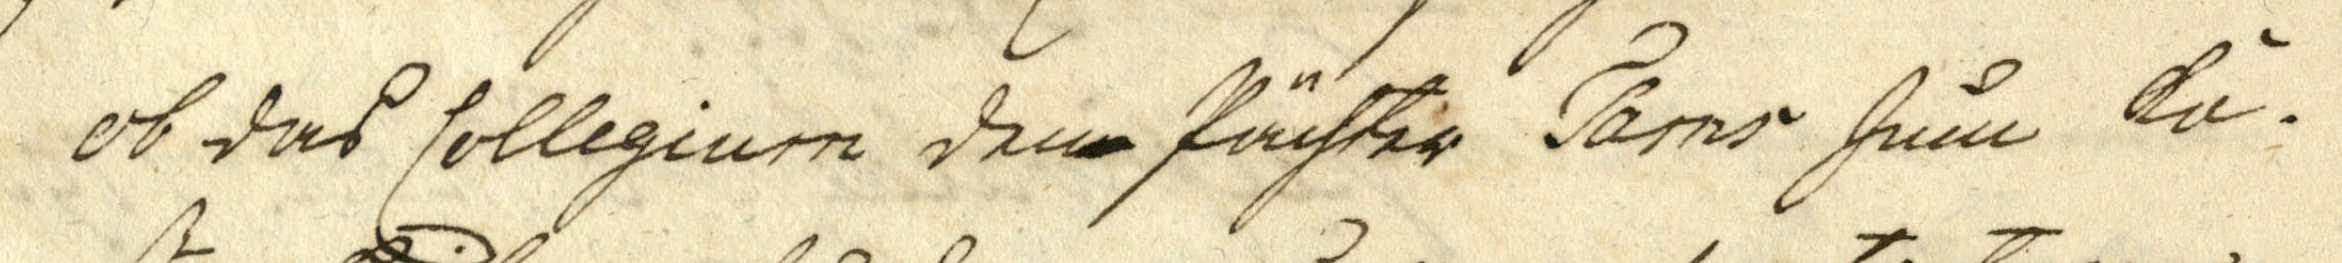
ob das Collegium dem Pächter Tams zum Ko¬
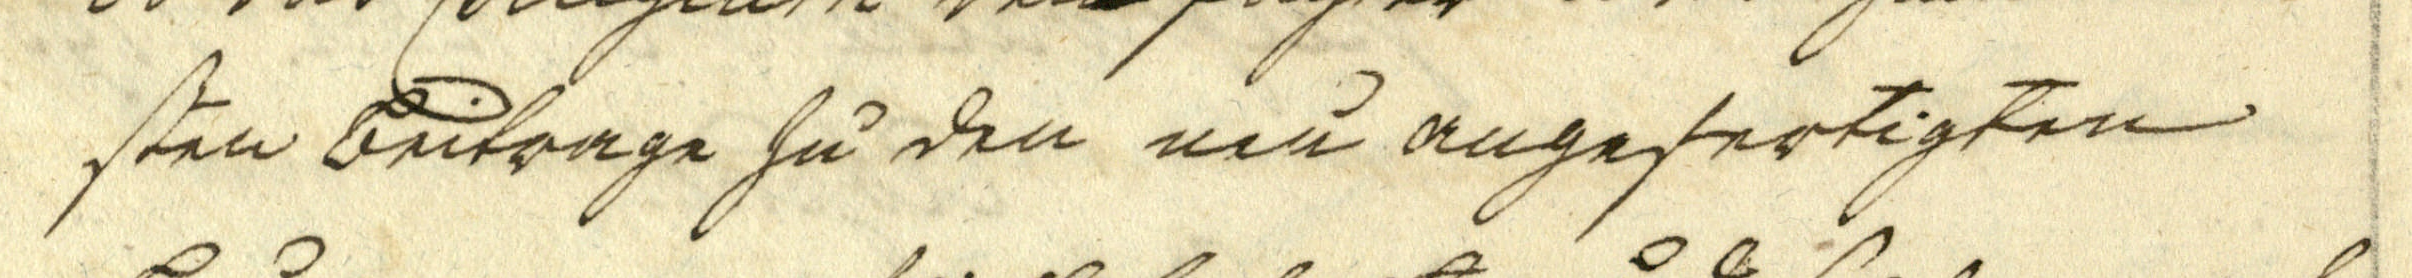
sten Beitrage zu den neu angefertigten
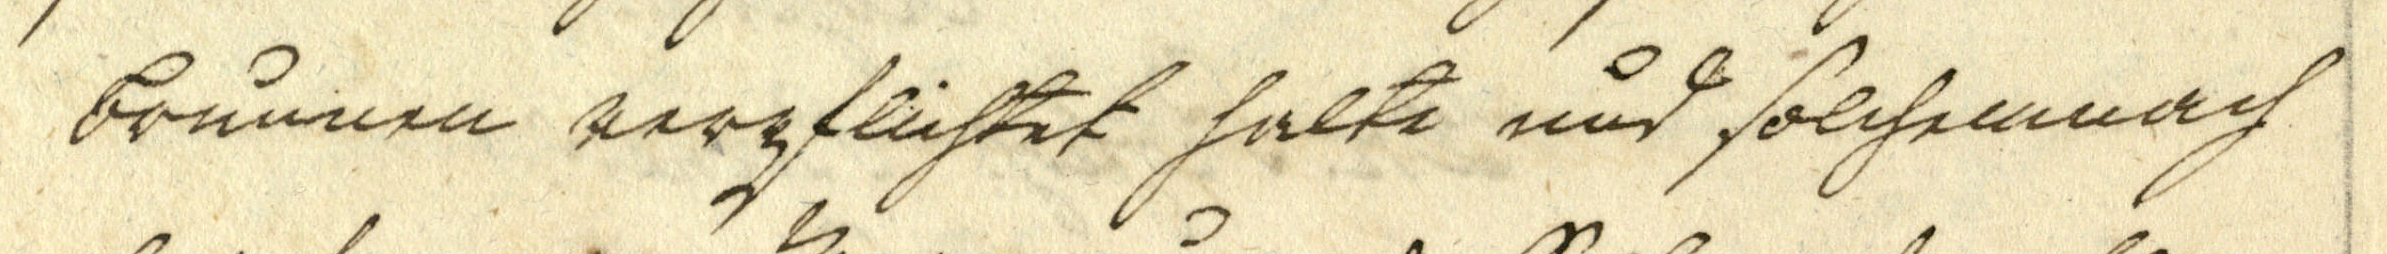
Brunnen verpflichtet halte und solchemnach
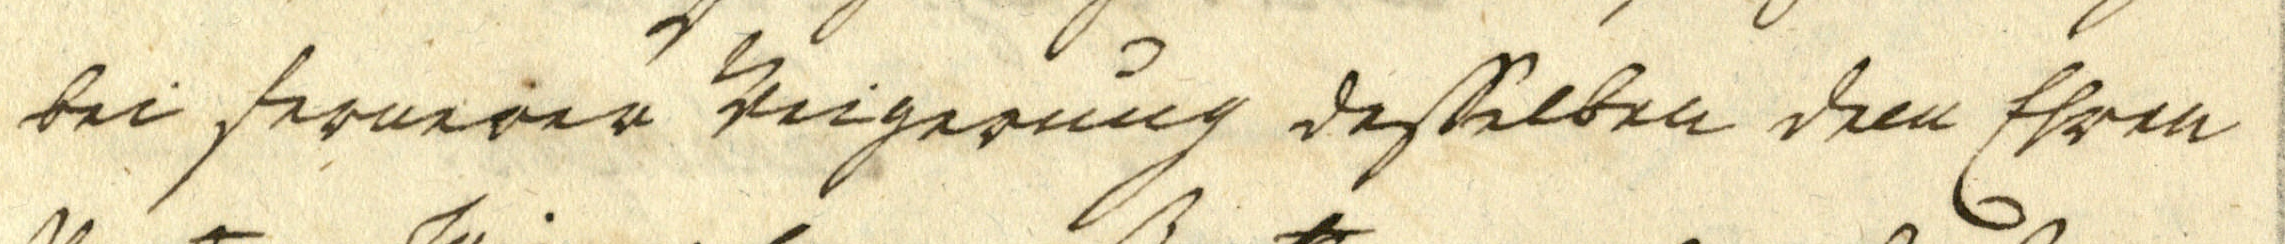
bei fernerer Weigerung desselben dem Ehren
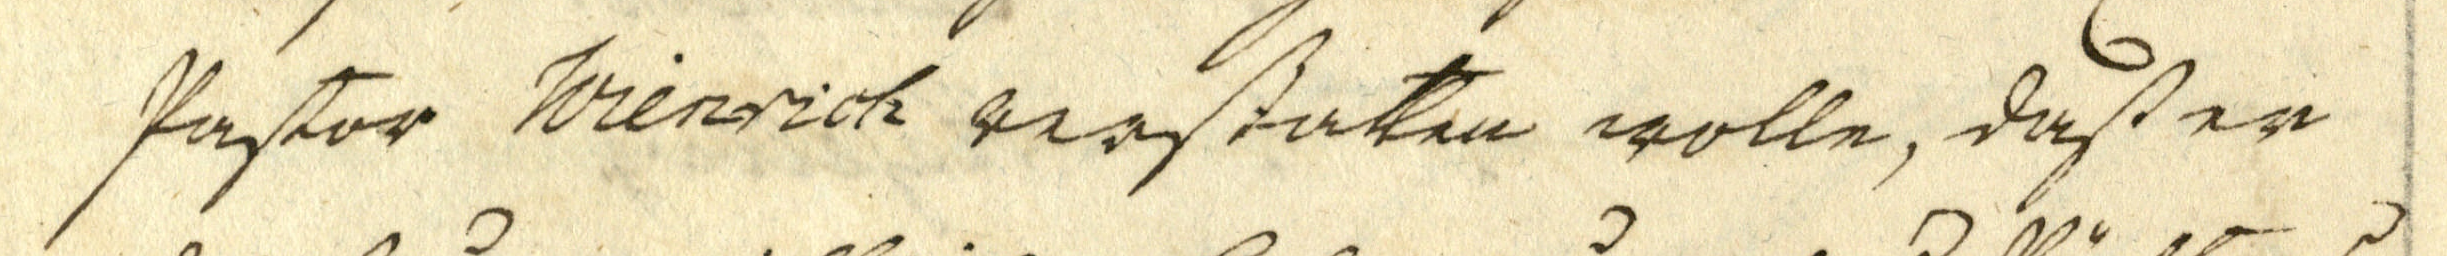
Pastor Wienrich verstatten wolle, daß er
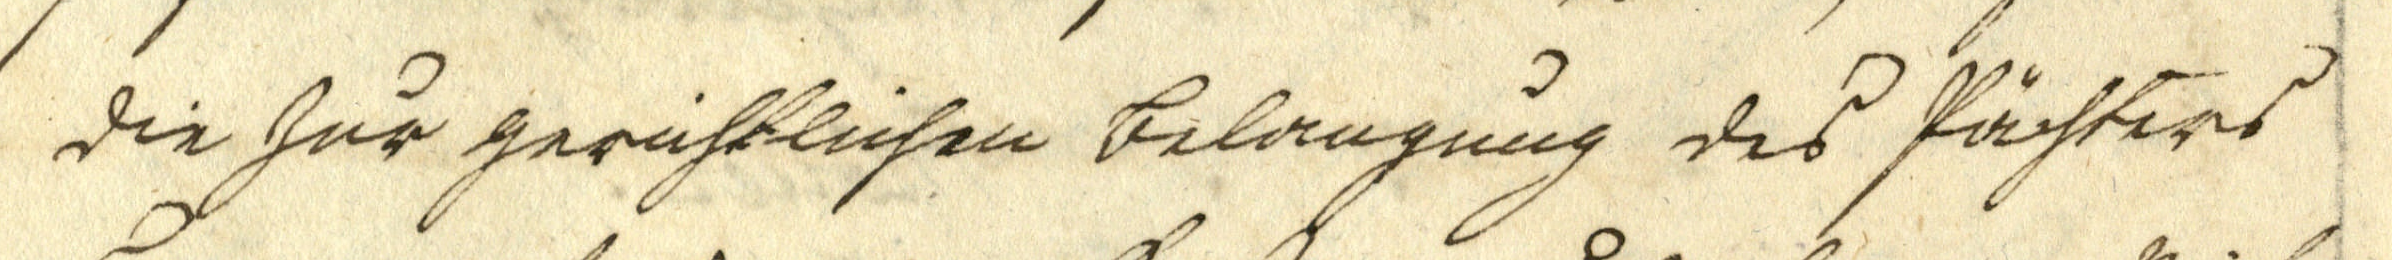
die zur gerichtlichen Belangung des Pächters
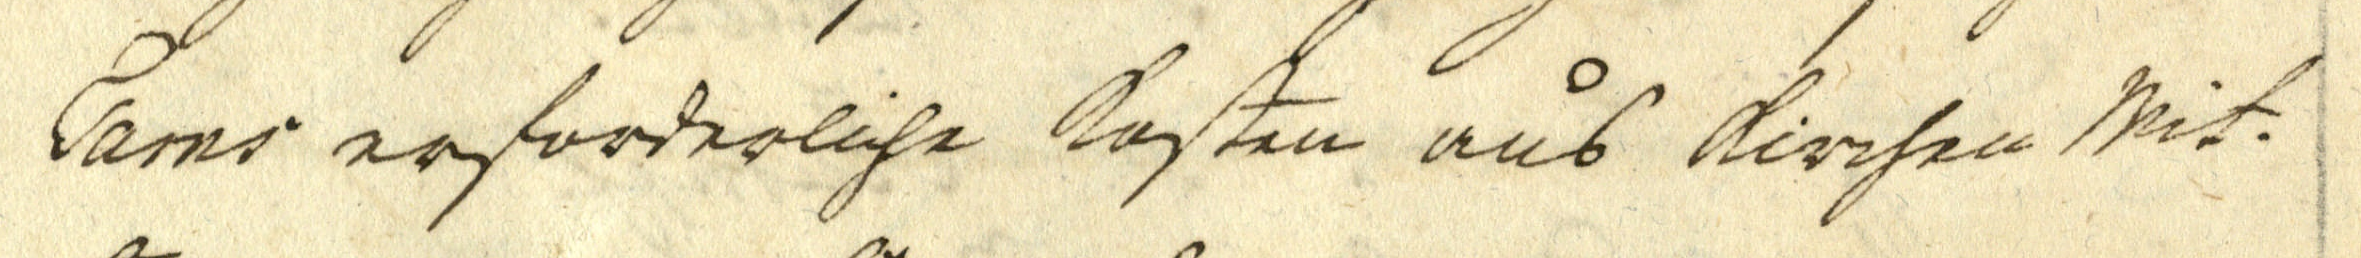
Tams erforderliche Kosten aus Kirchen Mit¬
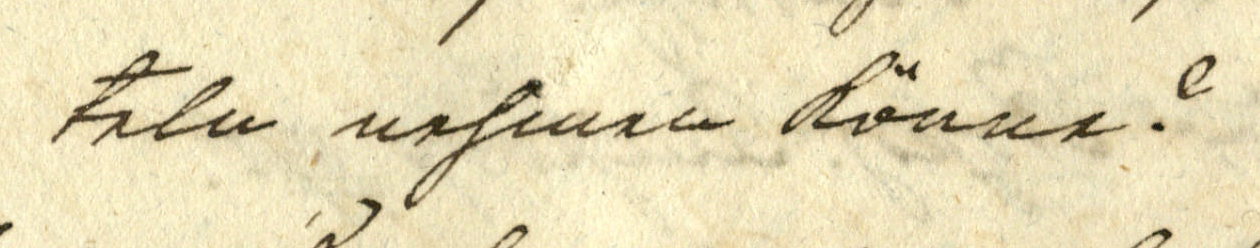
teln nehmen könne?
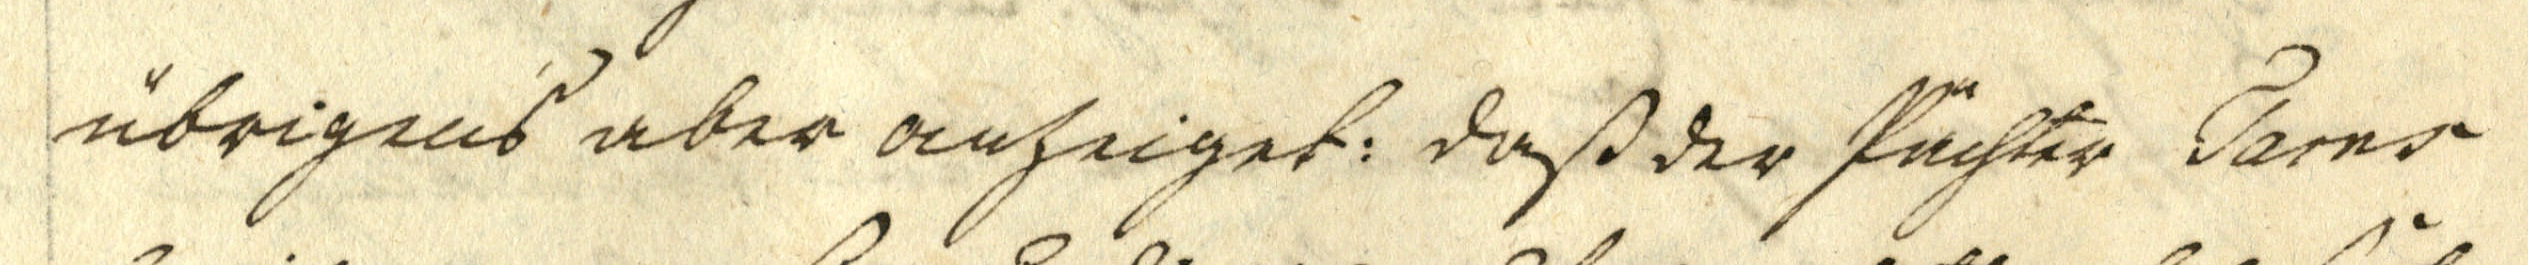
übrigens aber anzeiget: daß der Pächter Tams
